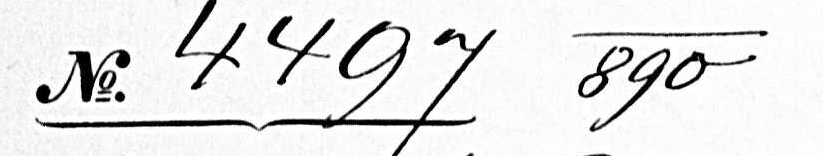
No. 4497 890
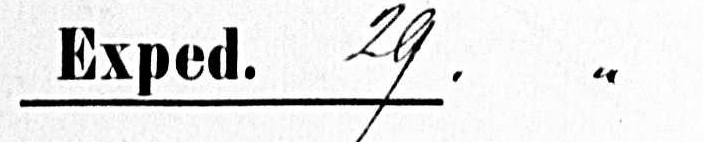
Exped. 29. October.
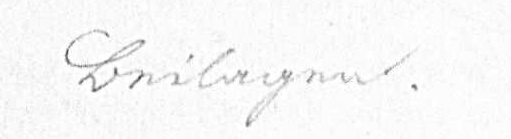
Beilagen.
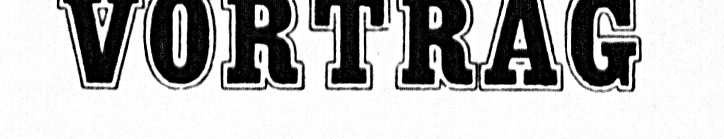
Vortrag
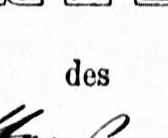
des
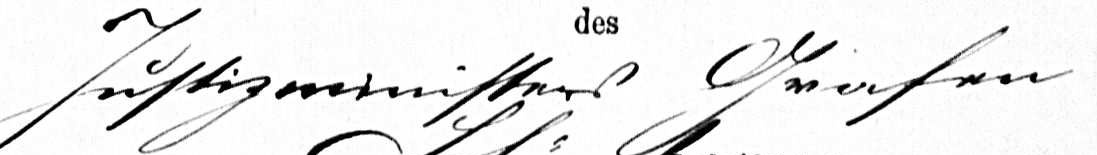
Justizminister Grafen
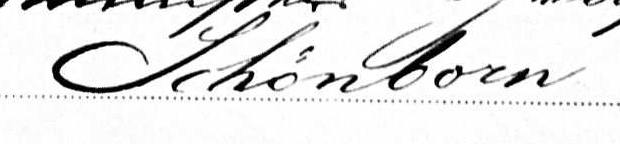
Schönborn
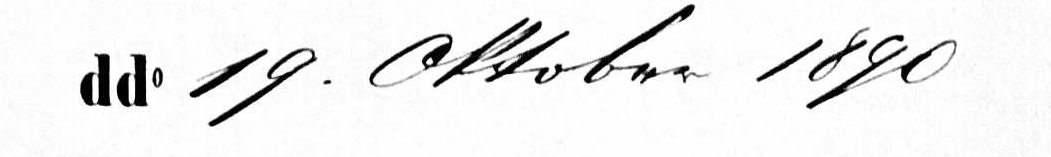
ddo 19. Oktober 1890
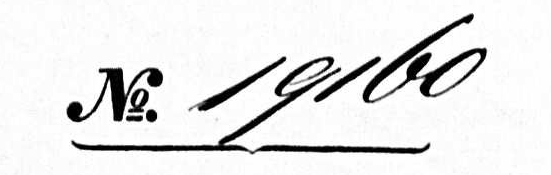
No. 19160
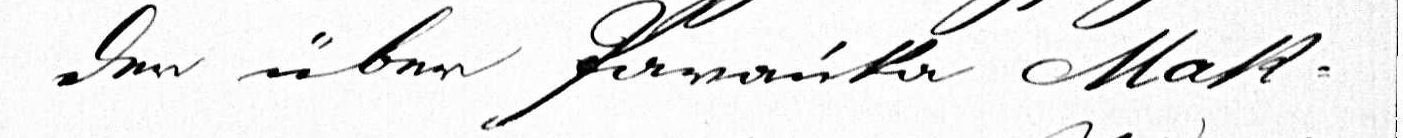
den über Parańka Mak¬
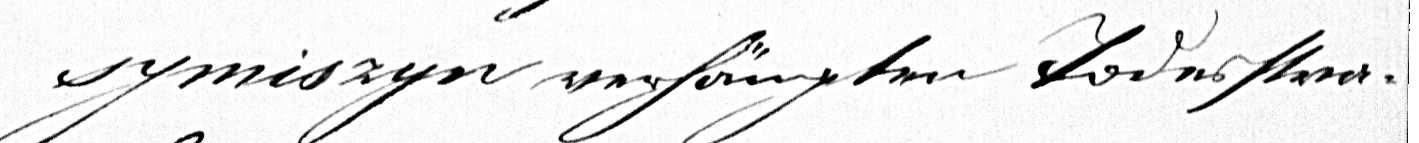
szmiszyn verhängten Todesstra¬
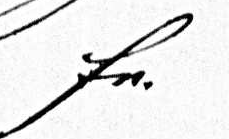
fe.
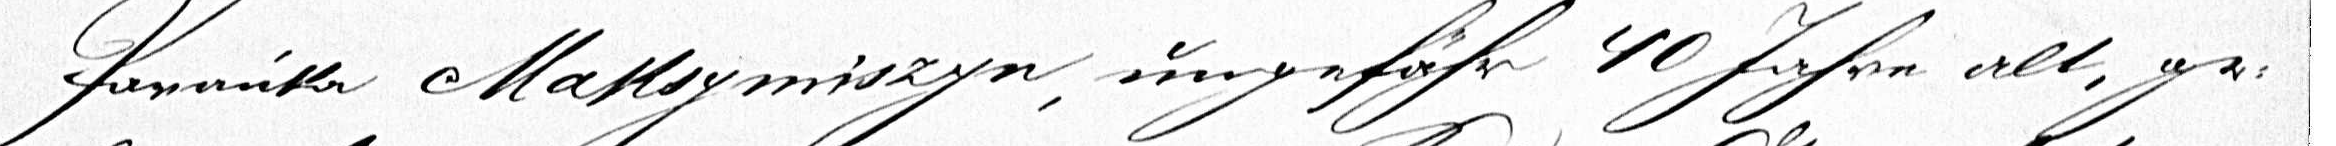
Parańka Maksymiszyn, ungefähr 40 Jahre alt, gr:
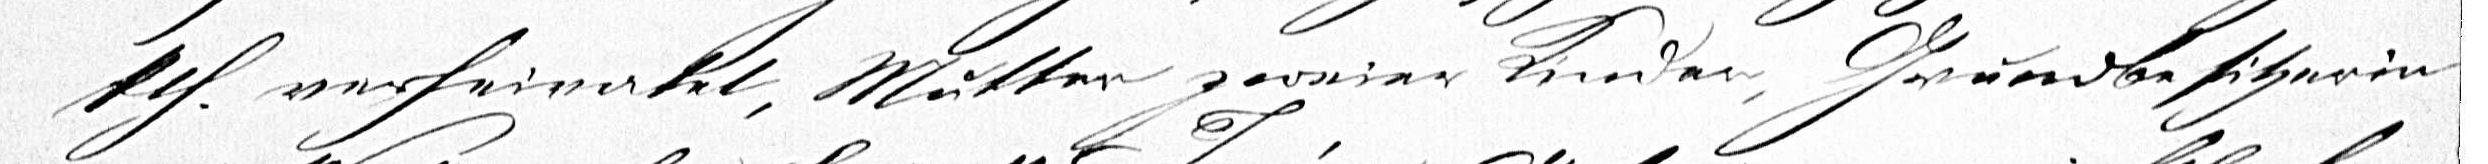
kth. verheiratet, Mutter zweier Kinder, Grundbesitzerin
